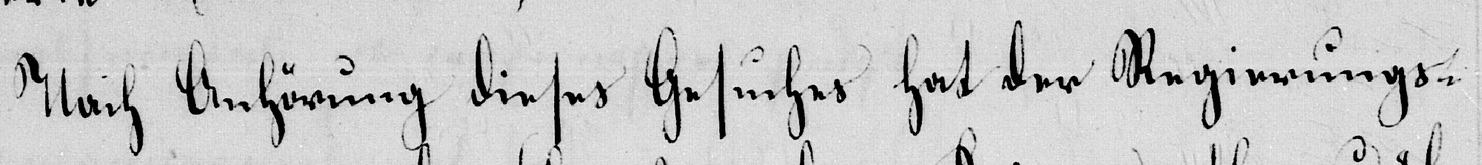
Nach Anhörung dieses Gesuches hat der Regierungs¬
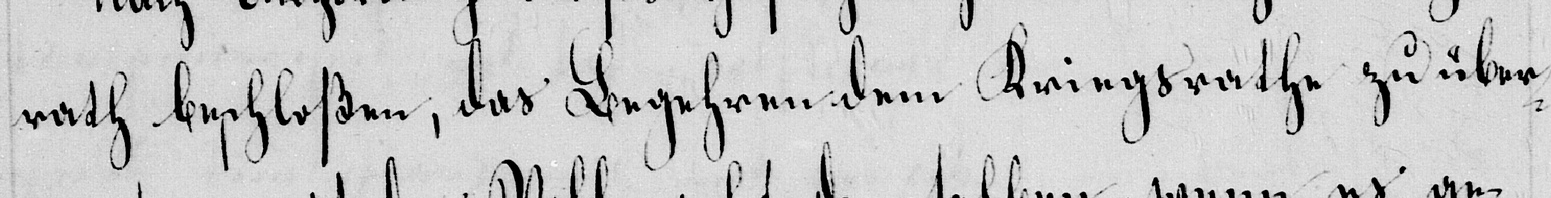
rath beschloßen, das Begehren dem Kriegsrathe zu über¬
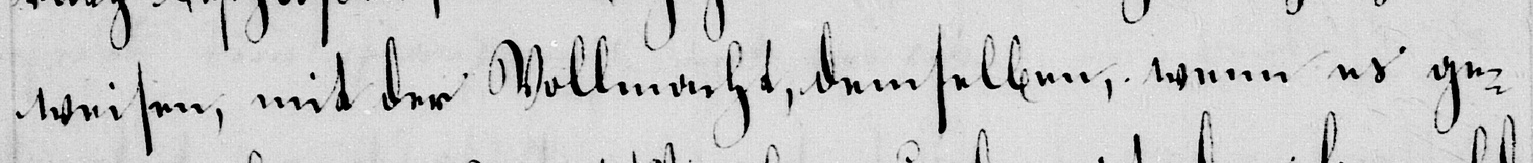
weisen, mit der Vollmacht, demselben, wenn es ge¬
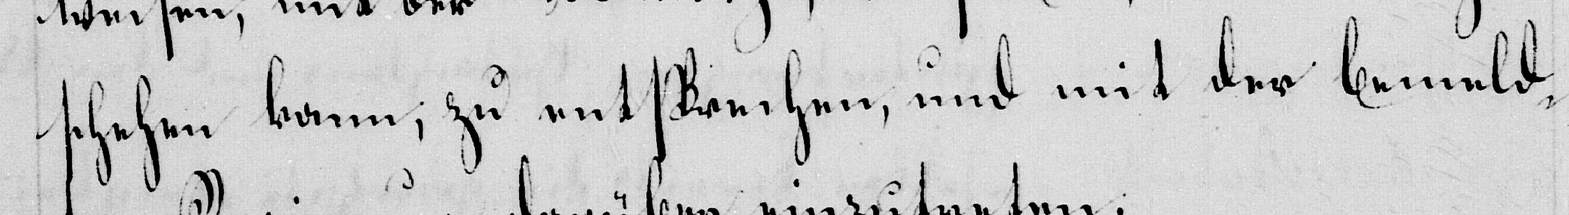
schehen kann, zu entsprechen, und mit der bemelde¬
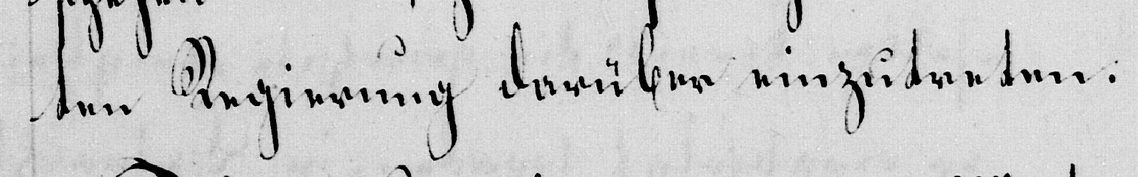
ten Regierung darüber einzutreten.
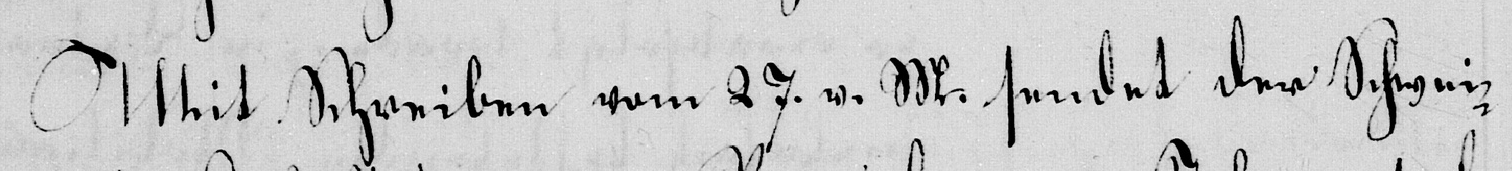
Mit Schreiben vom 27. v. M. sendet der Schwei¬
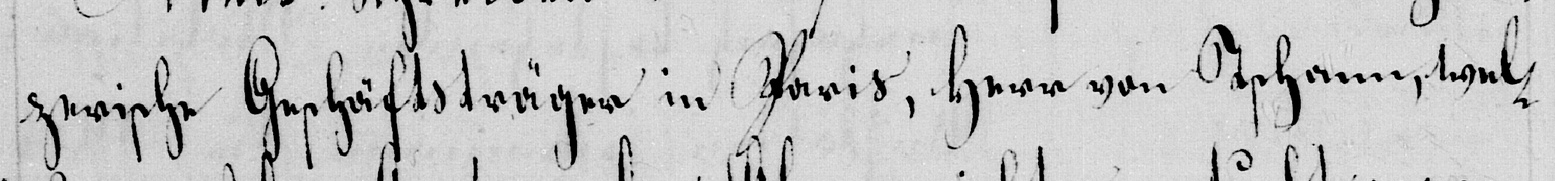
zerische Geschäftsträger in Paris, Herr von Tschann, welch¬
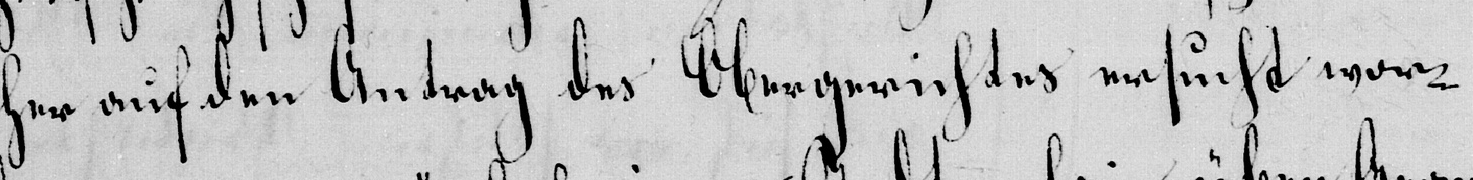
er auf den Antrag des Obergerichtes ersucht wor¬
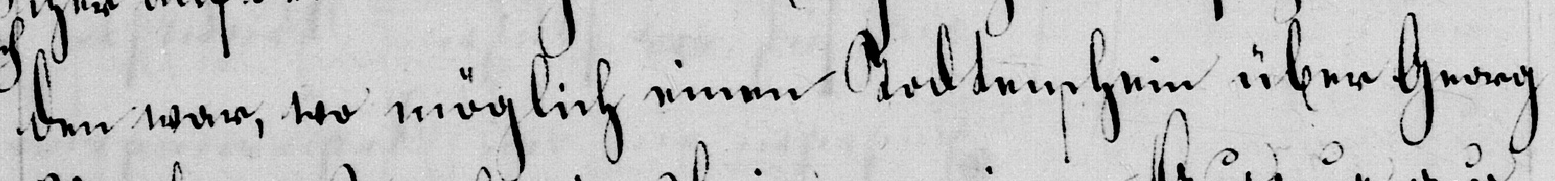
den war, wo möglich einen Todtenschein über Georg
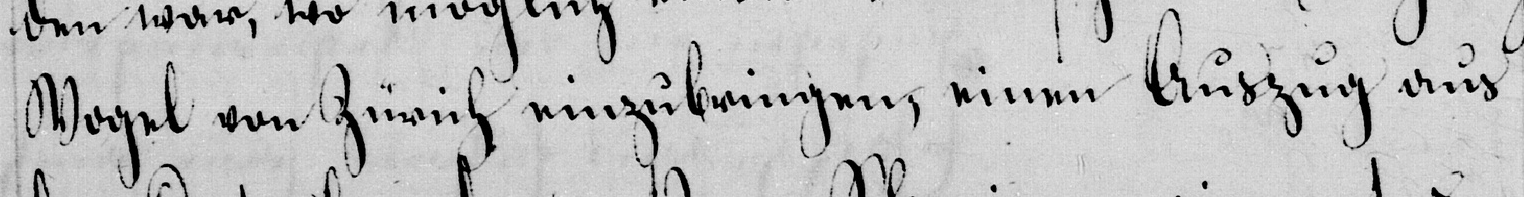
Vogel von Zürich einzubringen, einen Auszug aus
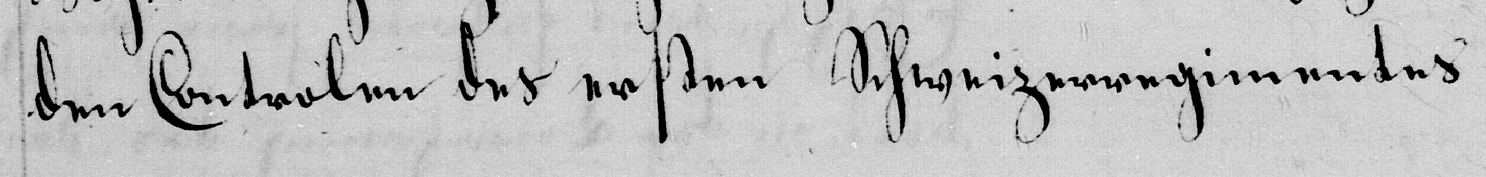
den Controlen des ersten Schweizerregimentes
